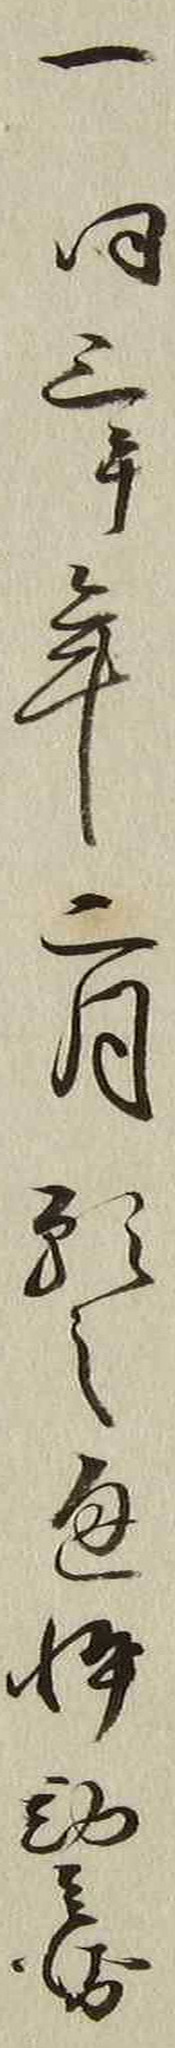一同三午年二月願い之通り倅勘兵衛
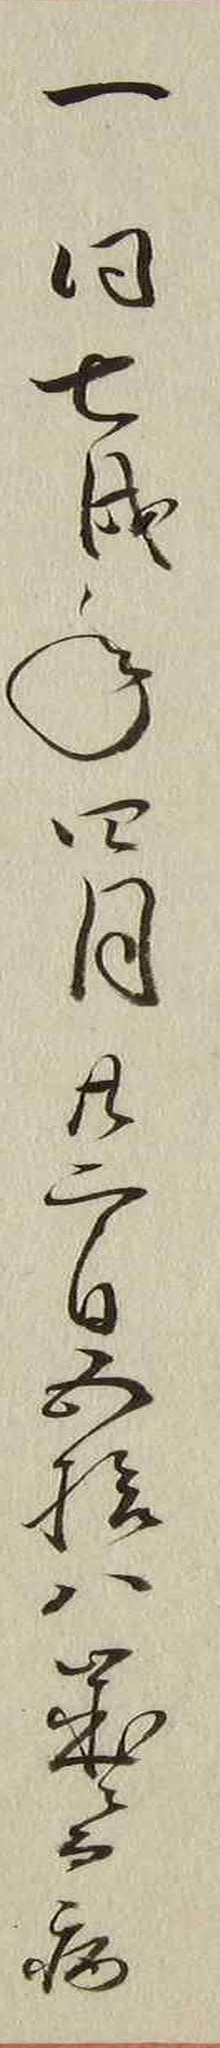一同七戌年四月廿二日五拾八歳ニて病
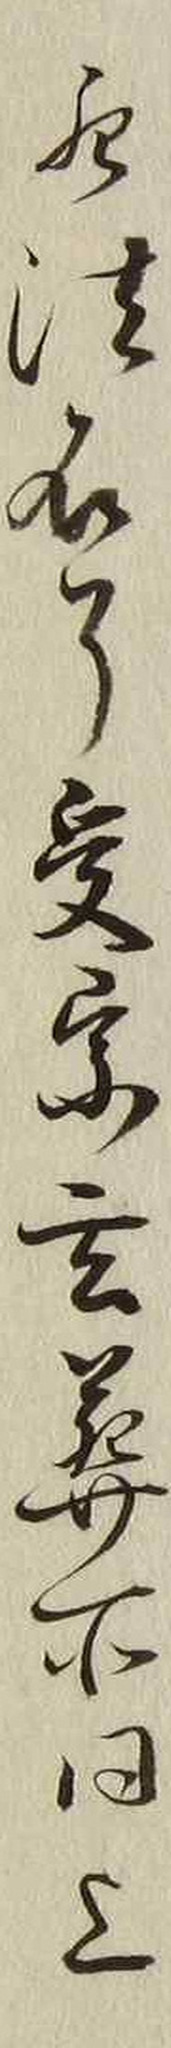死法名了受宗玄葬所同上
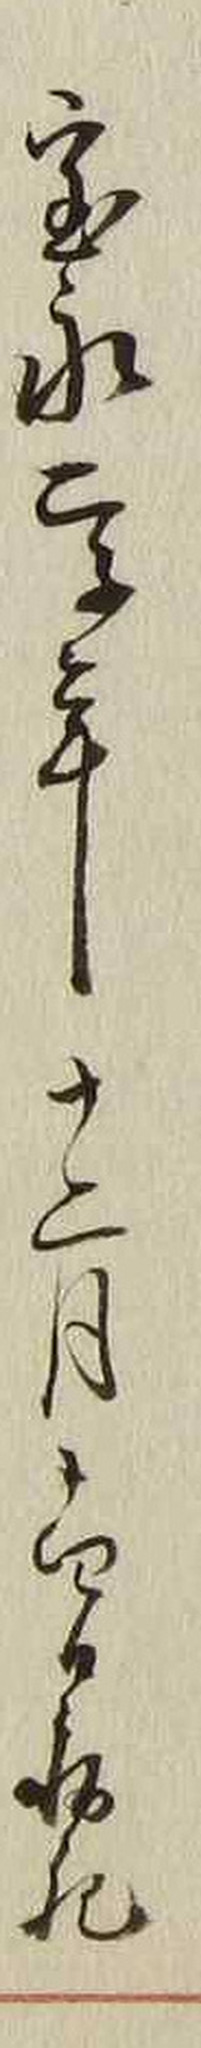宝永二子年十二月十四日病死
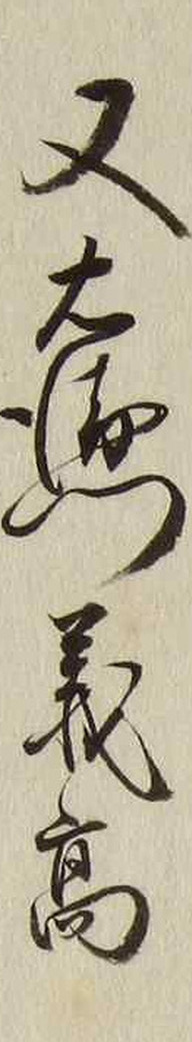又右衛門義高
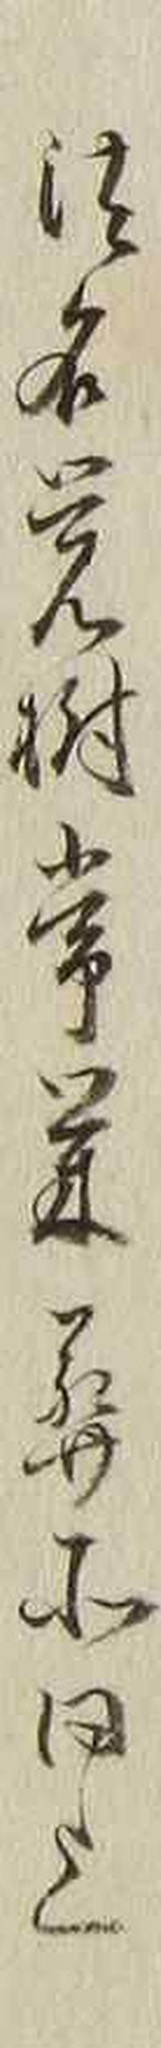法名覚柎常茱葬所同上
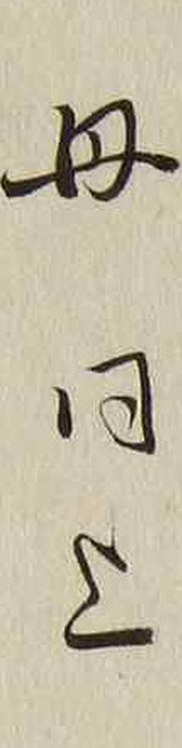母同上

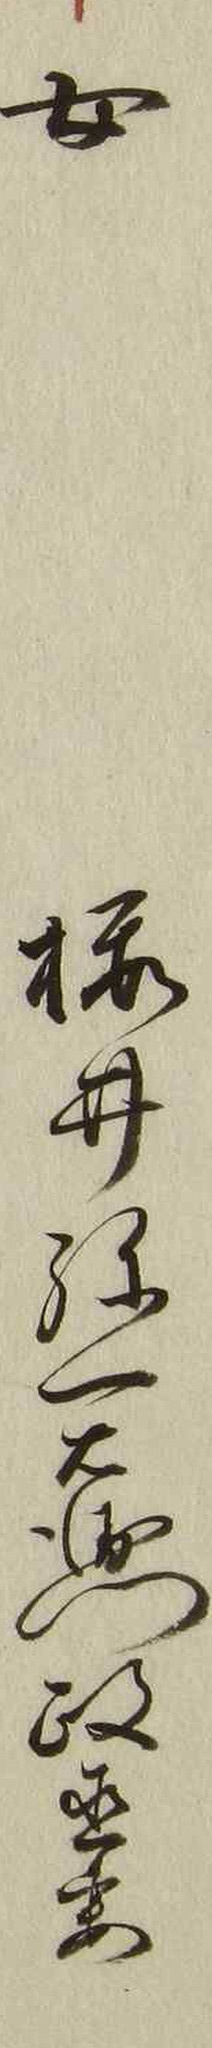女桜井弥一右衛門政直妻
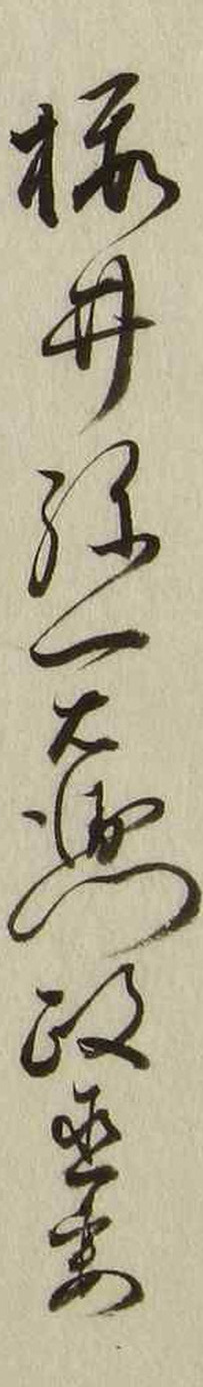女桜井弥一右衛門政直妻
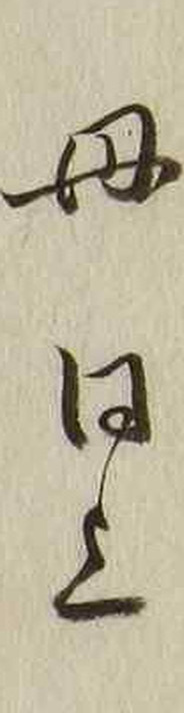母同上
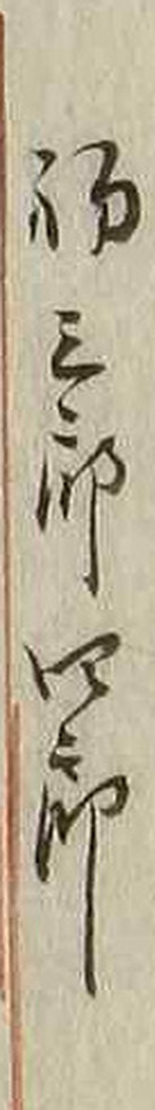初三郎四郎
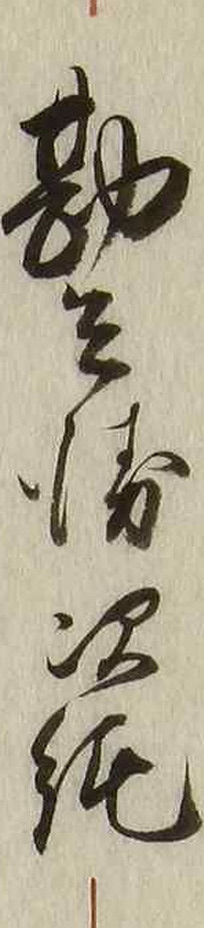勘兵衛次純
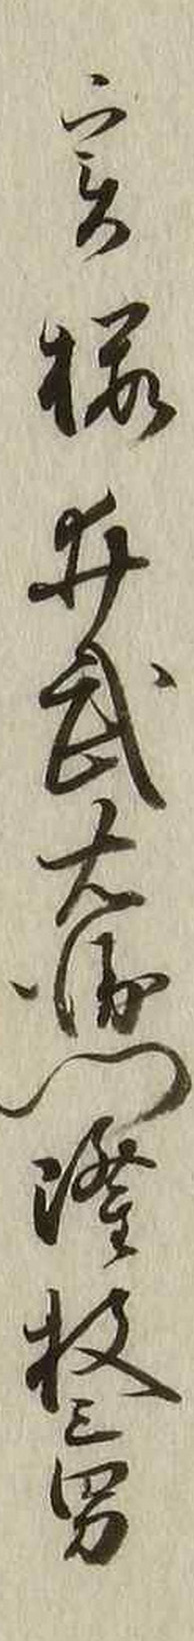実桜井武右衛門隆杖三男
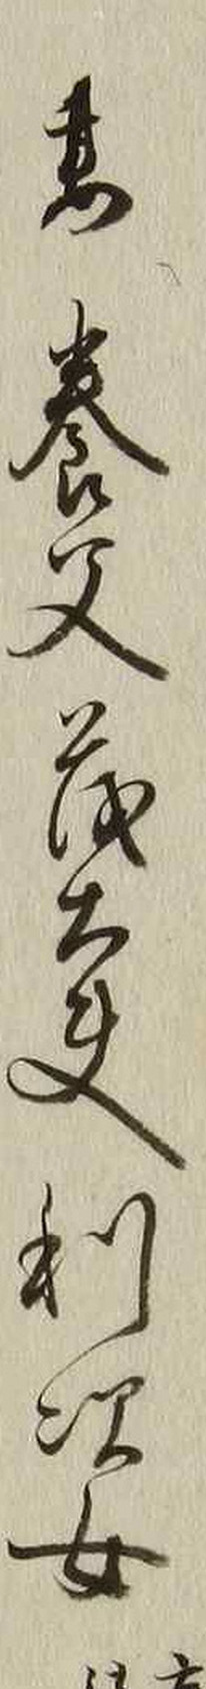妻養父茂大夫利次女
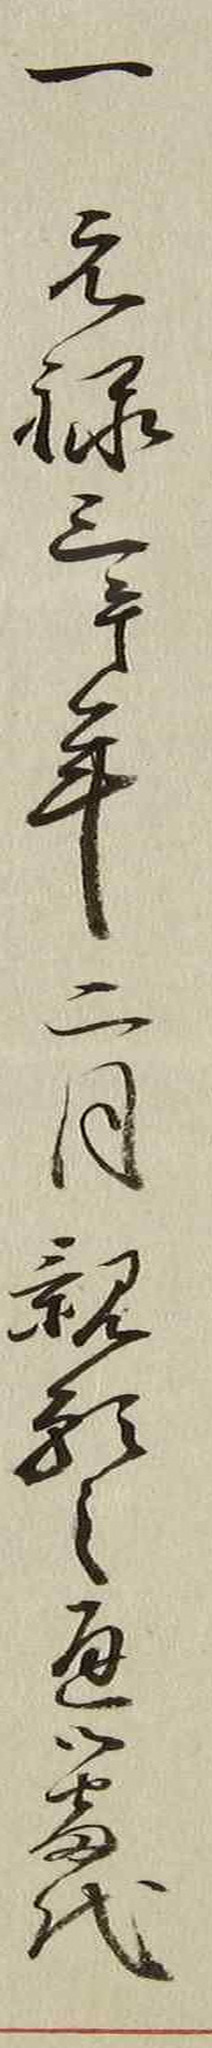一元禄三午年二月親願い之通り御番代
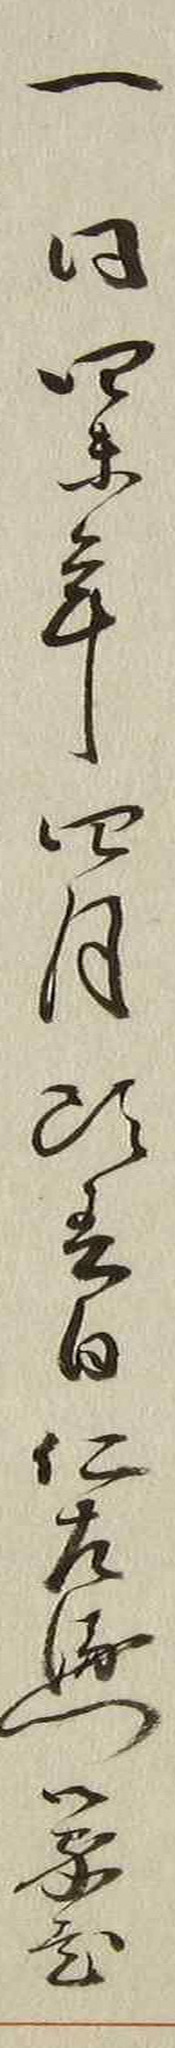一同四未年四月頃春日仁左衛門御家老
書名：諸士系譜　巻之20　い之部20
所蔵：会津若松市立会津図書館
